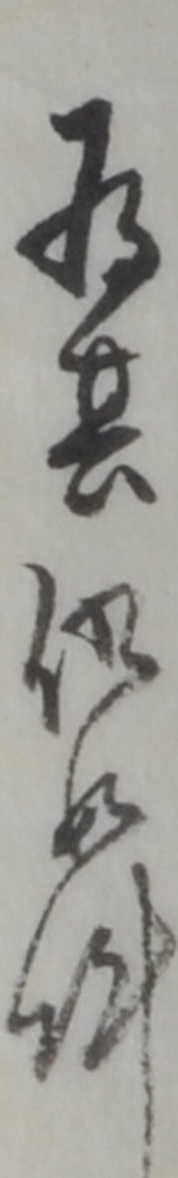為其仍如件

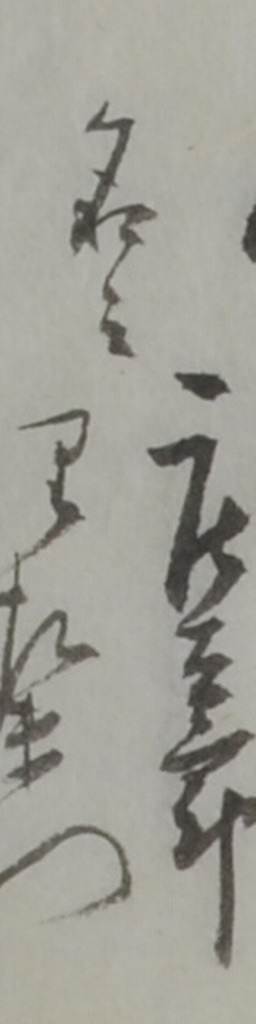名主理左衛門
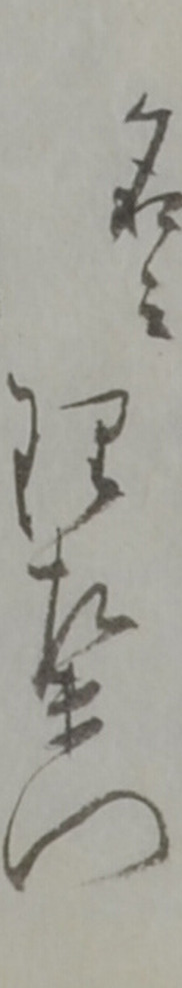名主理左衛門
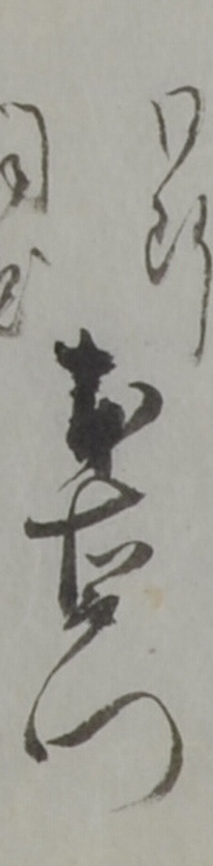同断本右衛門
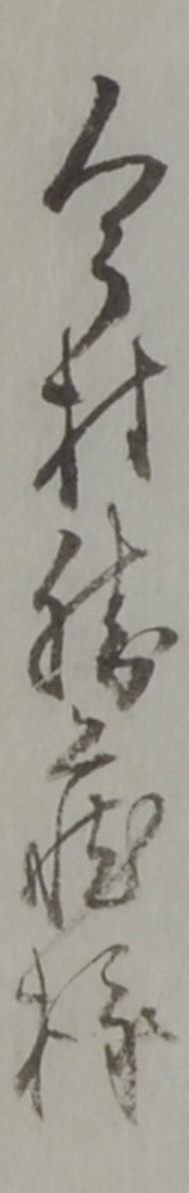今村勝蔵様
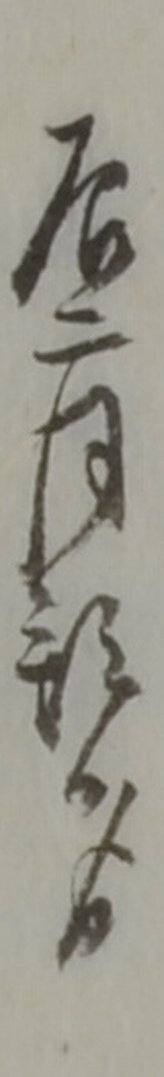辰二月朔日ゟ
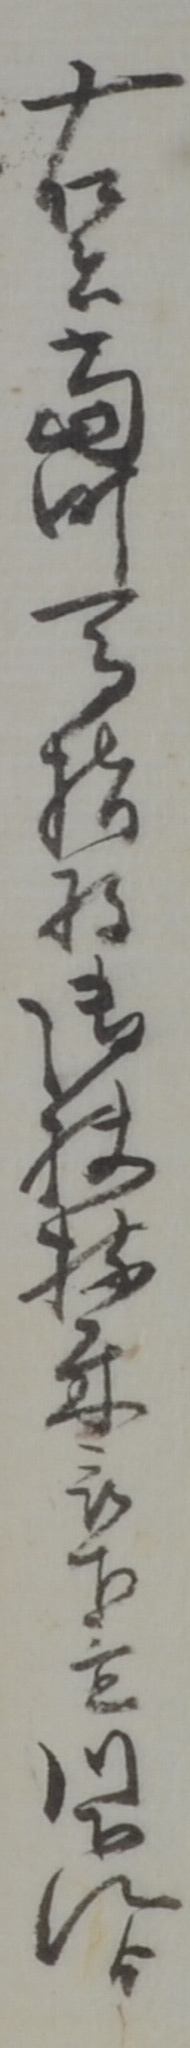右者当町馬指為御扶持米被下置川下郷ゟ
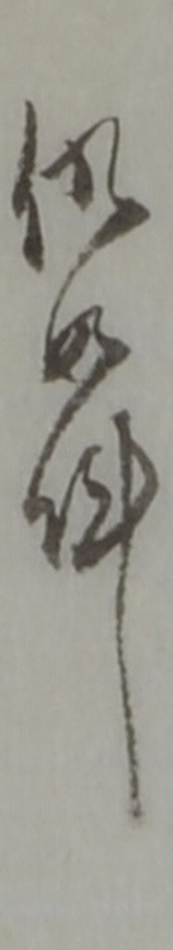仍如件
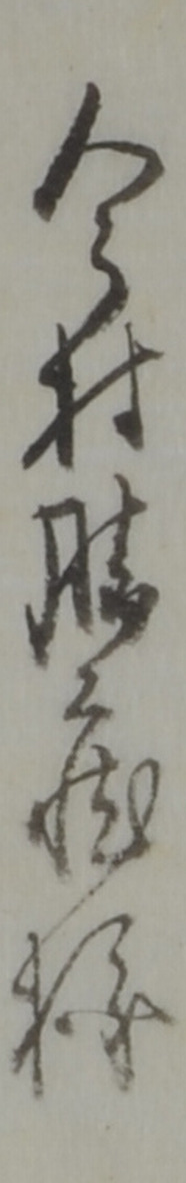今村勝蔵様
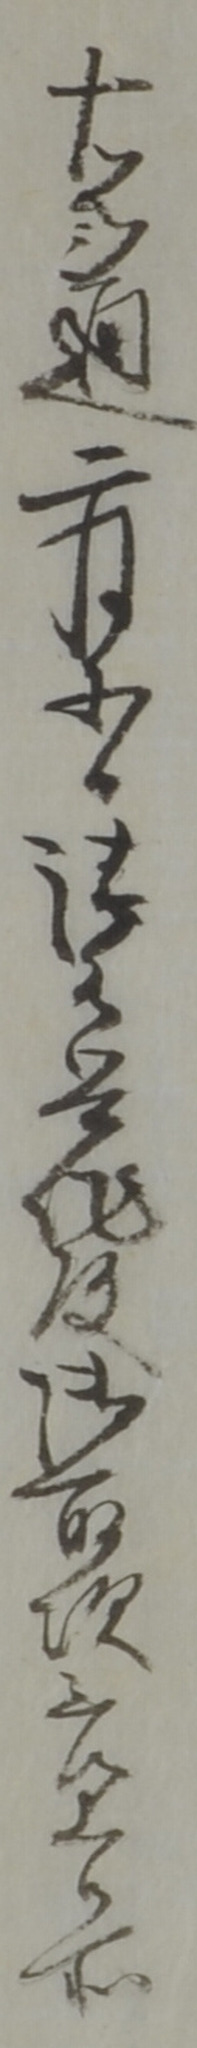右弐通二月五日清水兵作殿御取次差上候所

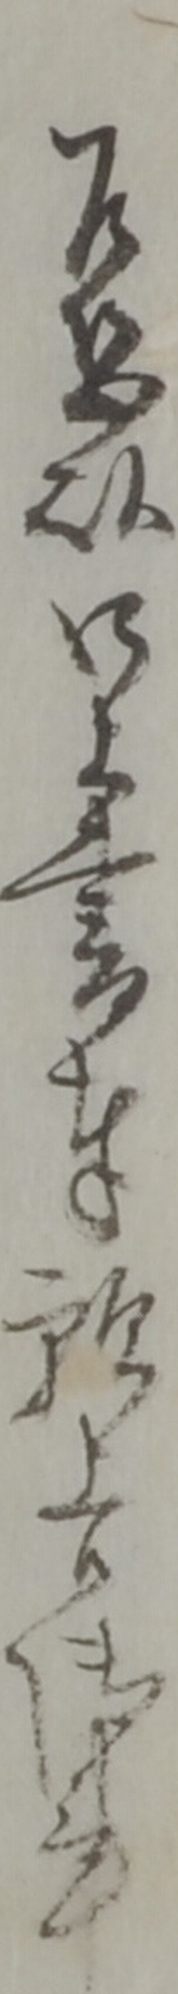乍恐以口上書奉願上候御事
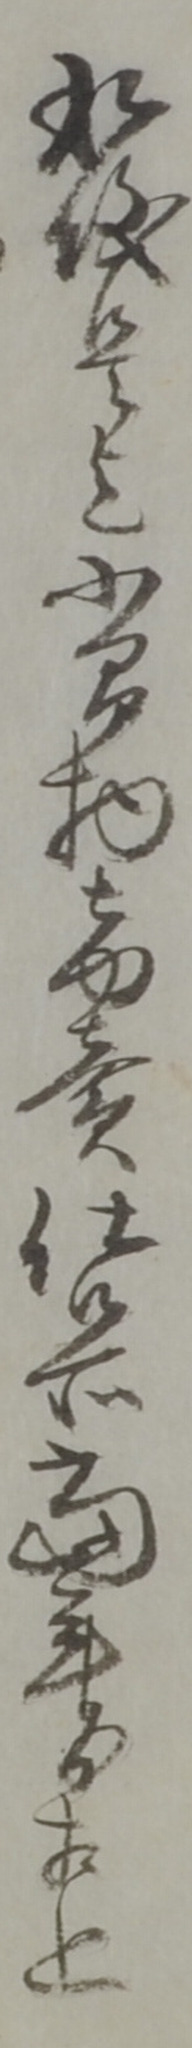私儀是迄小間物商売仕候所当年ゟ相止
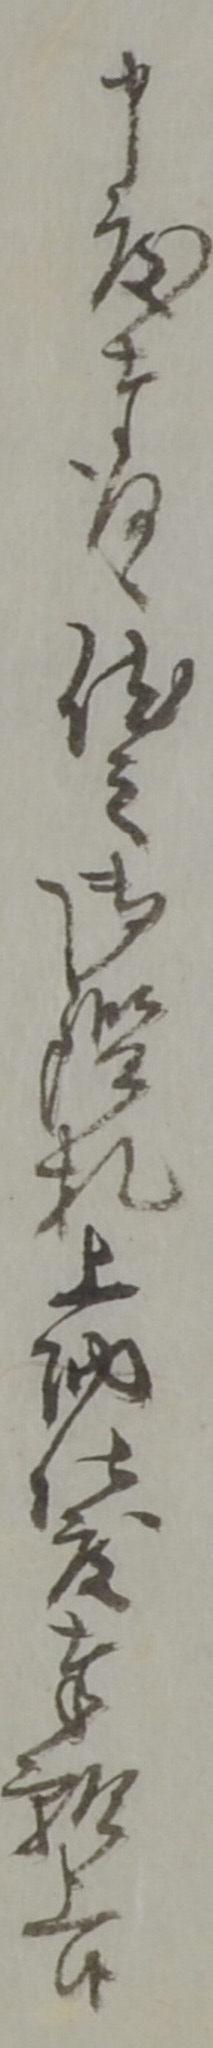申度奉存候依之御鑑札上納仕度奉願上候
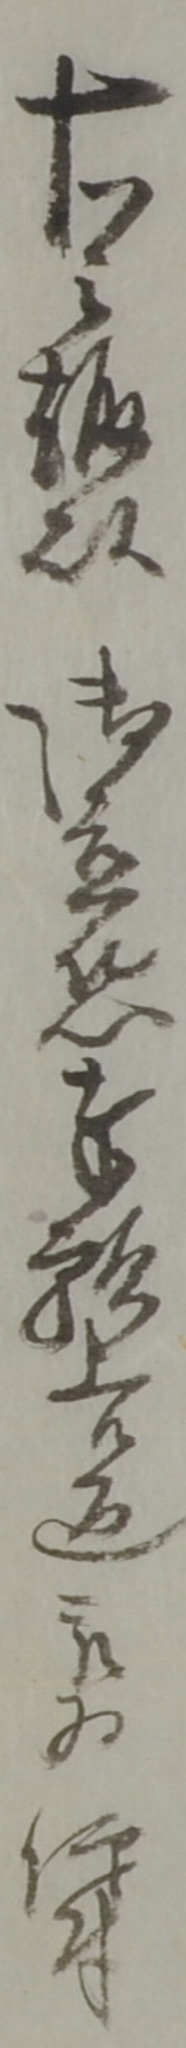右之趣以御慈悲奉願上候通被為仰付
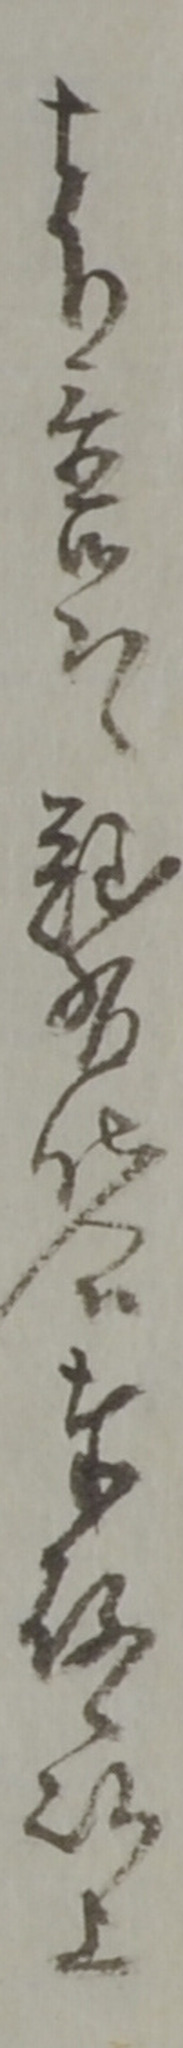被下置候ハヽ難有仕合奉存候以上
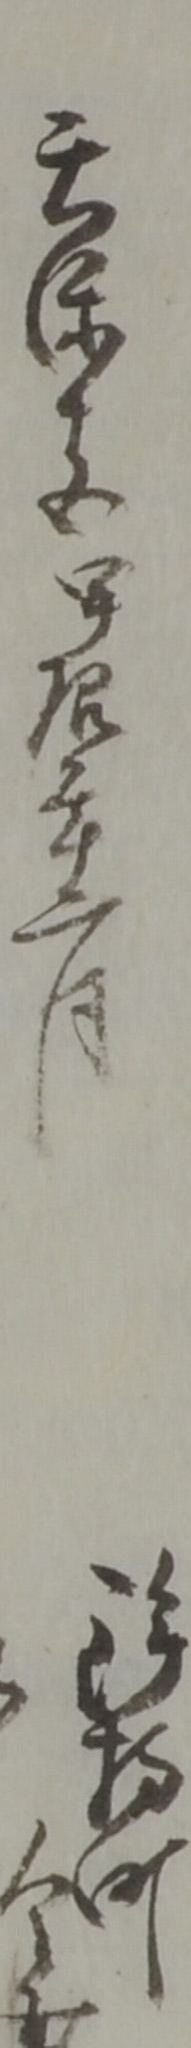天保十五甲辰年二月鉾持町
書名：諸願書控簿
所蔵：伊那市立高遠町図書館・合同会社AMANE
